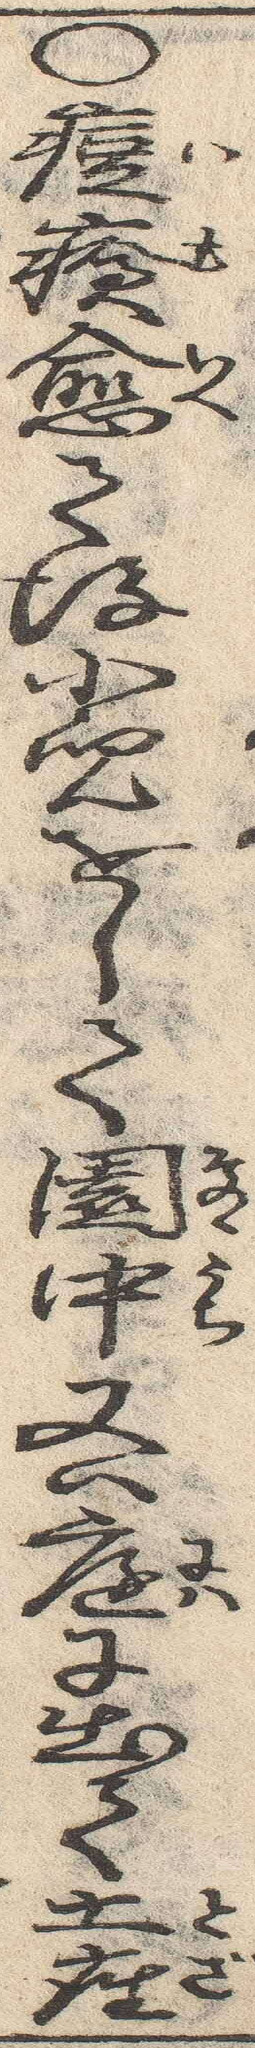○痘瘡愈て後小児をして園中又は庭に出て土座
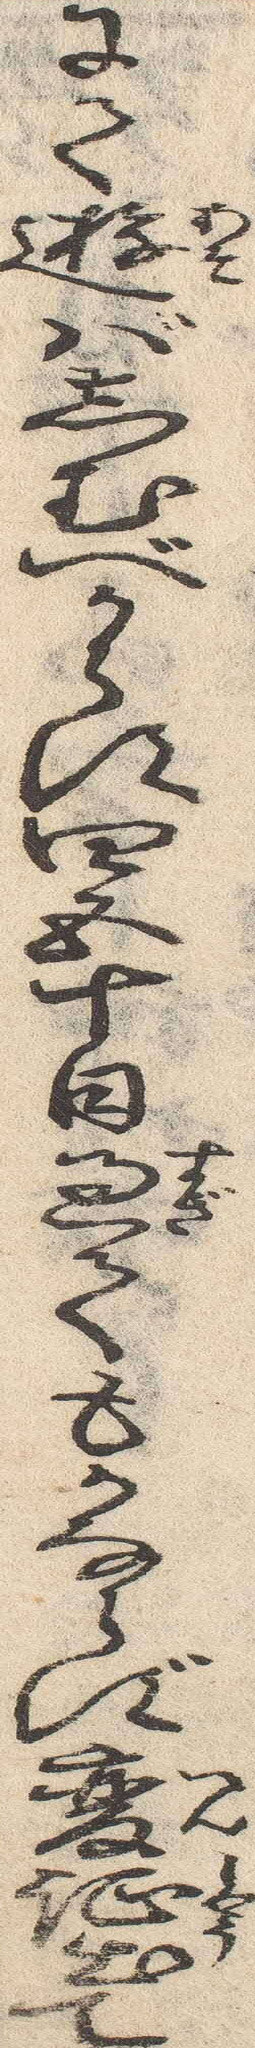にて遊ばしむべからす四五十日過てもかならず変証出て
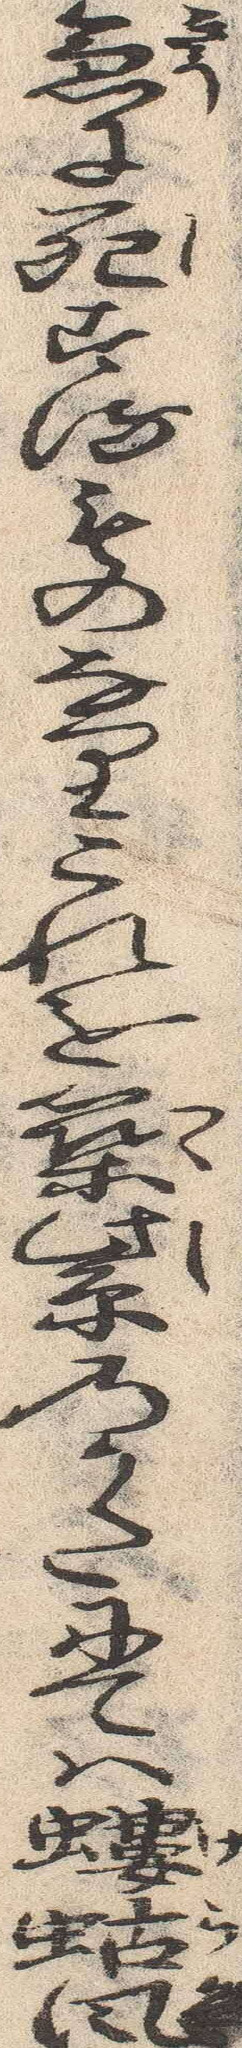急に死するものなりこれを築紫のかたにては螻蛄風
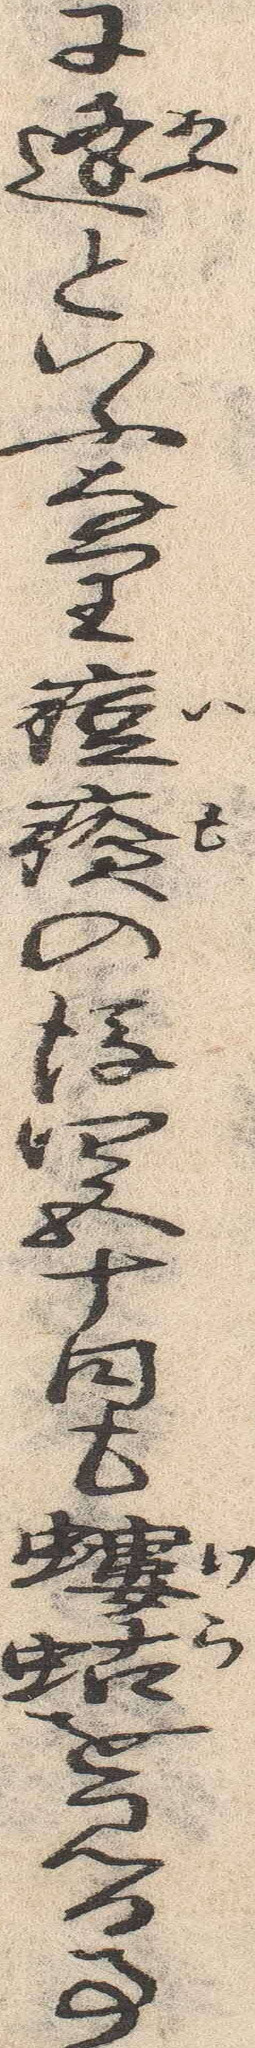に逢といふなり痘瘡の後四五十日も螻蛄を見る事
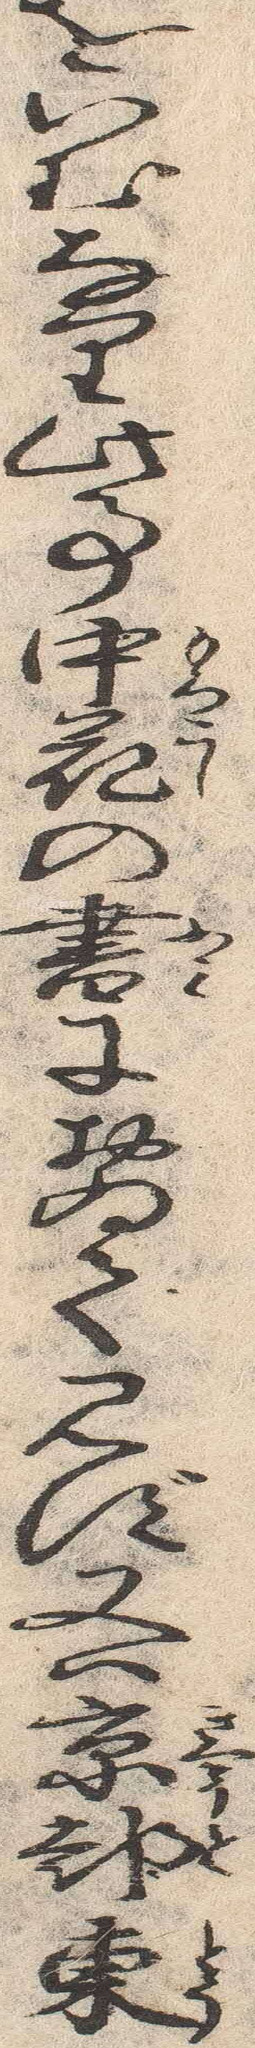をいむなり此事中花の書におゐて見ず又は京都東
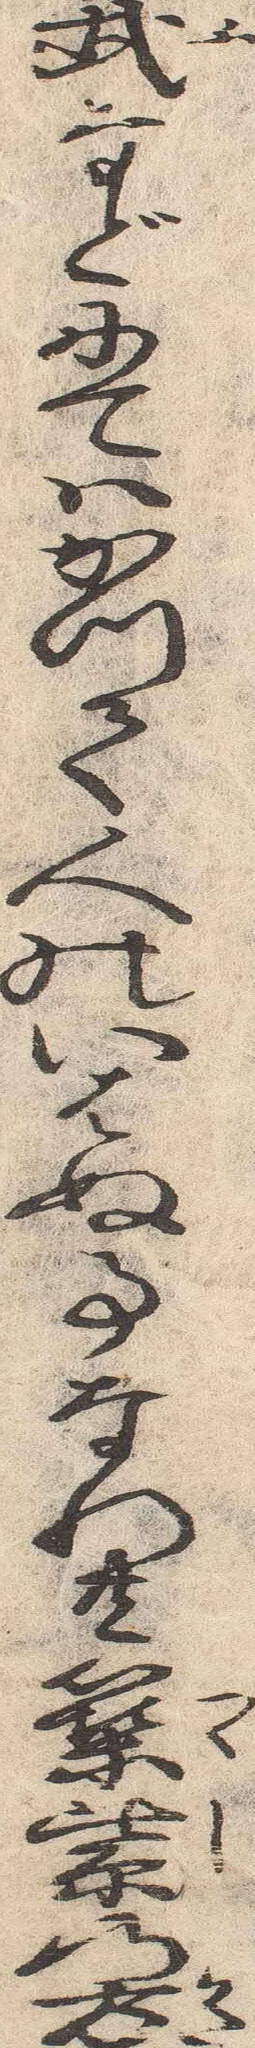武などにてはかつて人のいはぬ事なれ共築紫の方
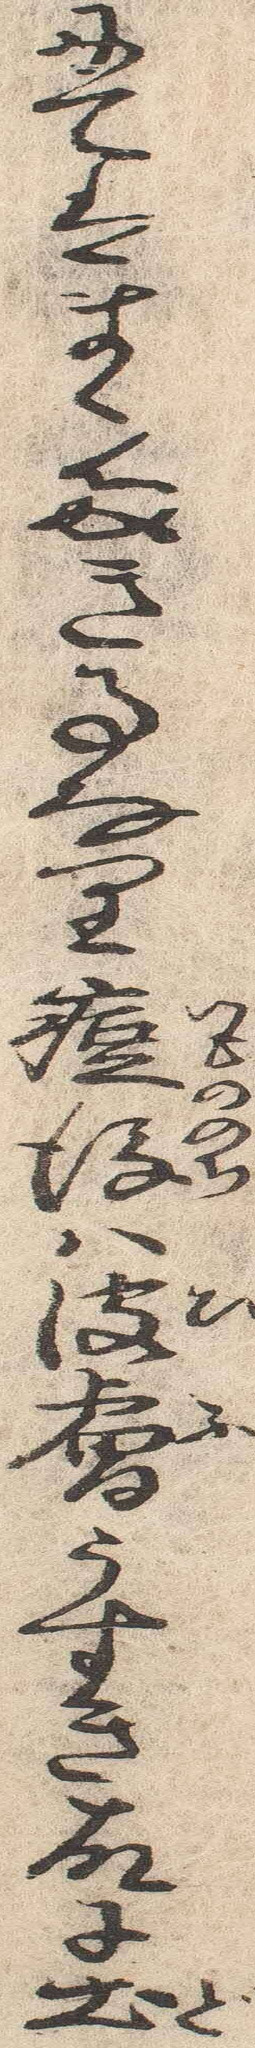にてはまゝ多き事なり痘後は皮膚うすき故に土
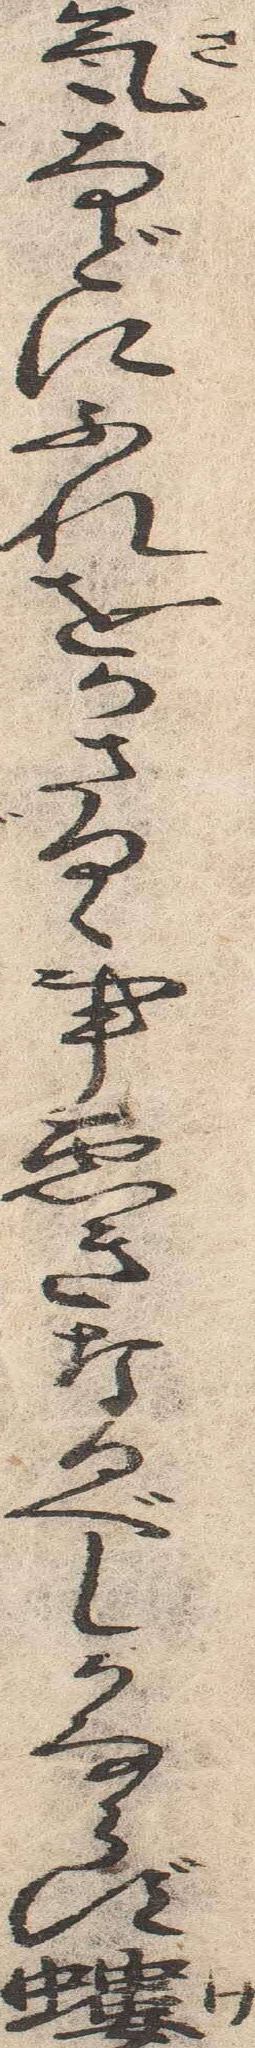気などにふれをかさるゝ事悪きなるべしかならず螻
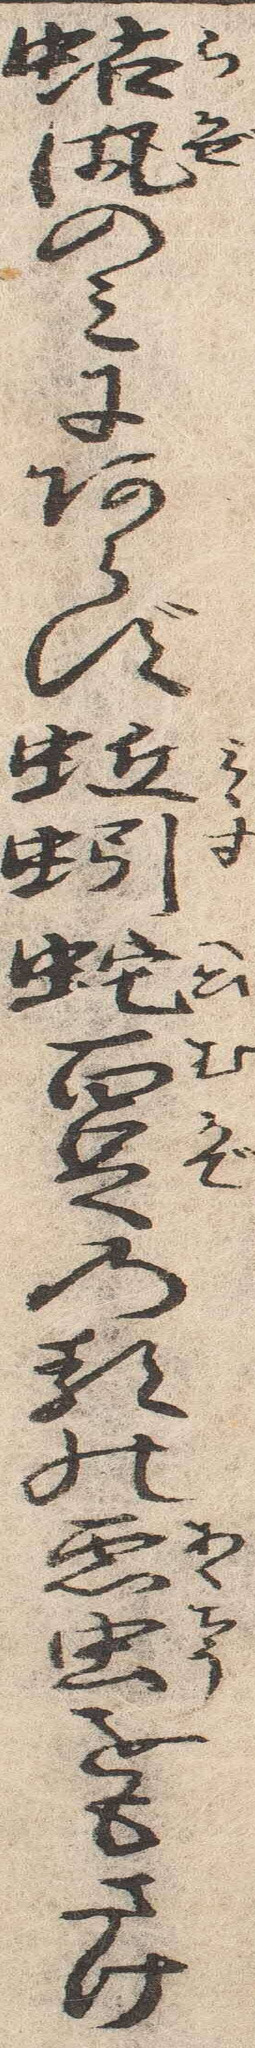蛄風のみにあらず蚯蚓蛇百足の類の悪虫をもさけ
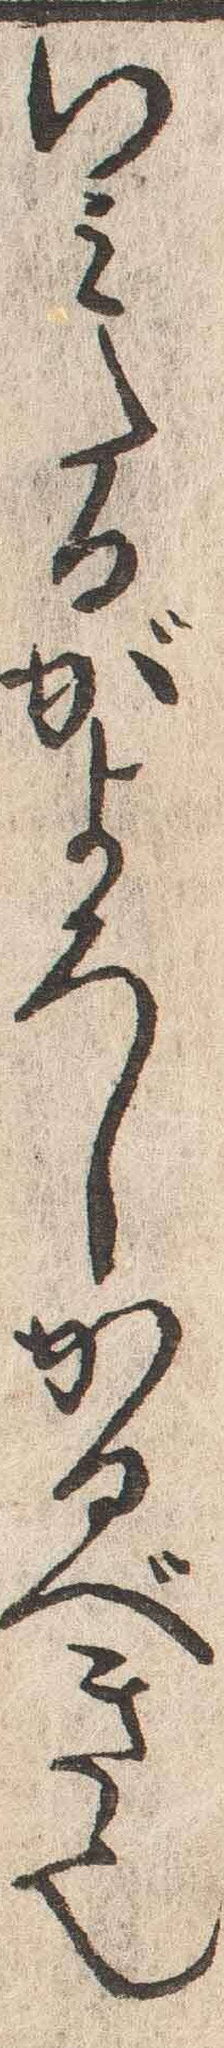いみたるがよろしかるべき也
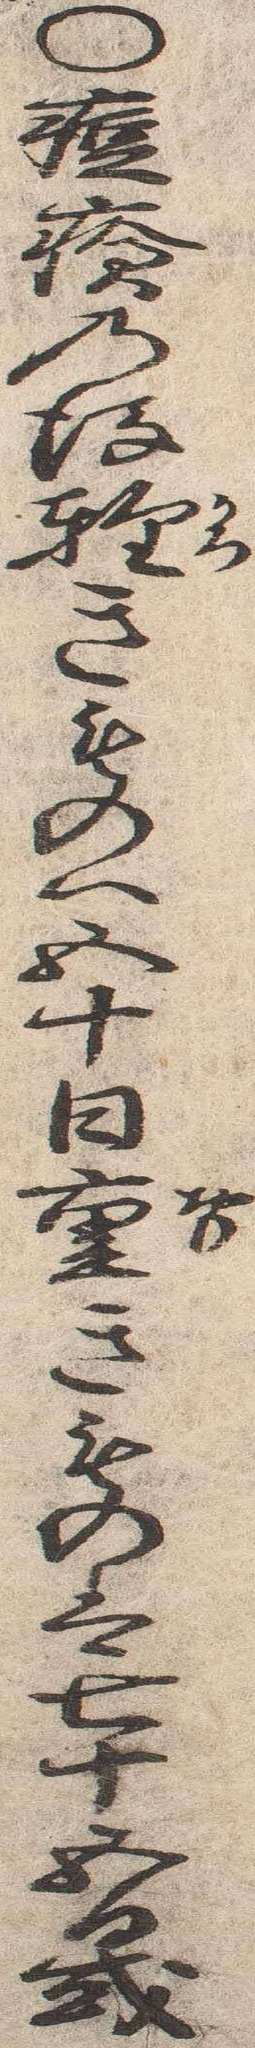○痘瘡の後軽きものは五十日重きものは七十五日或
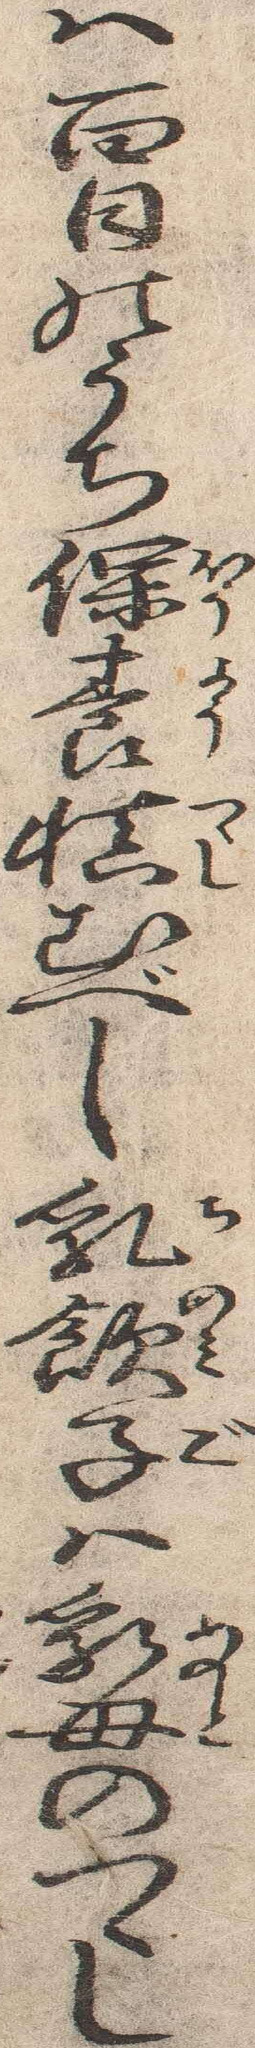は百日のうち保養慎むべし乳飲子は乳母のつゝし
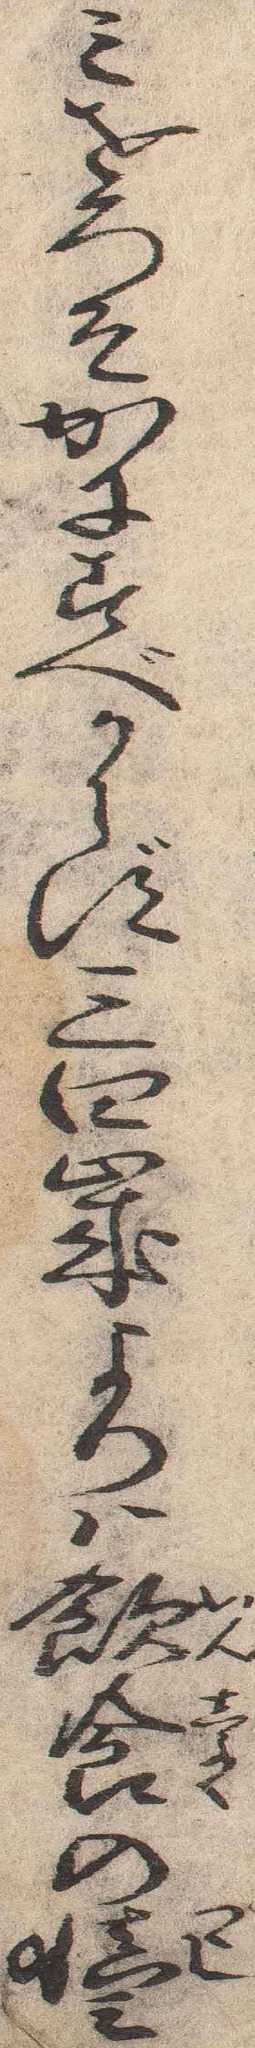みをろそかにすべからず三四歳よりは飲食の慎み

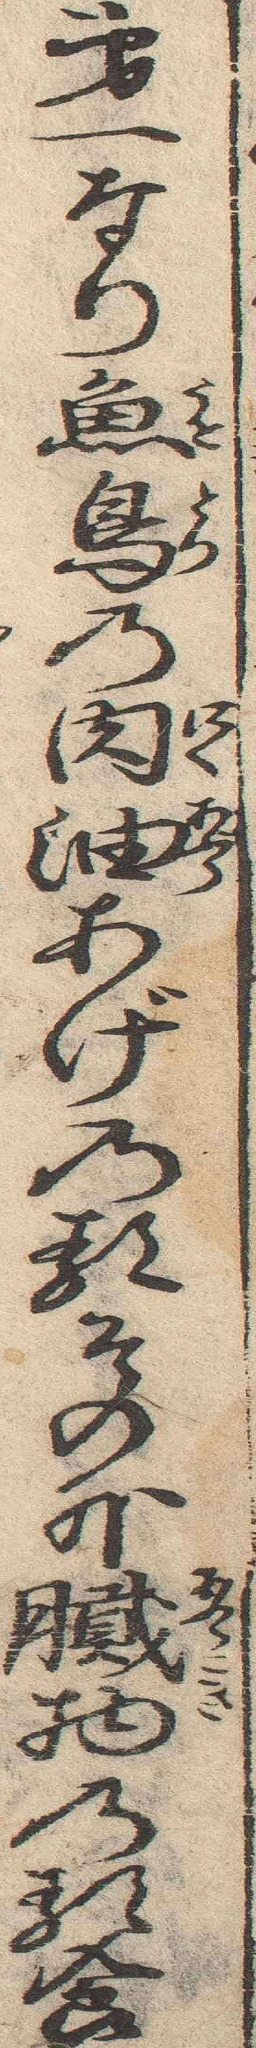第一なり魚鳥の肉油あげの類その外膩物の類食
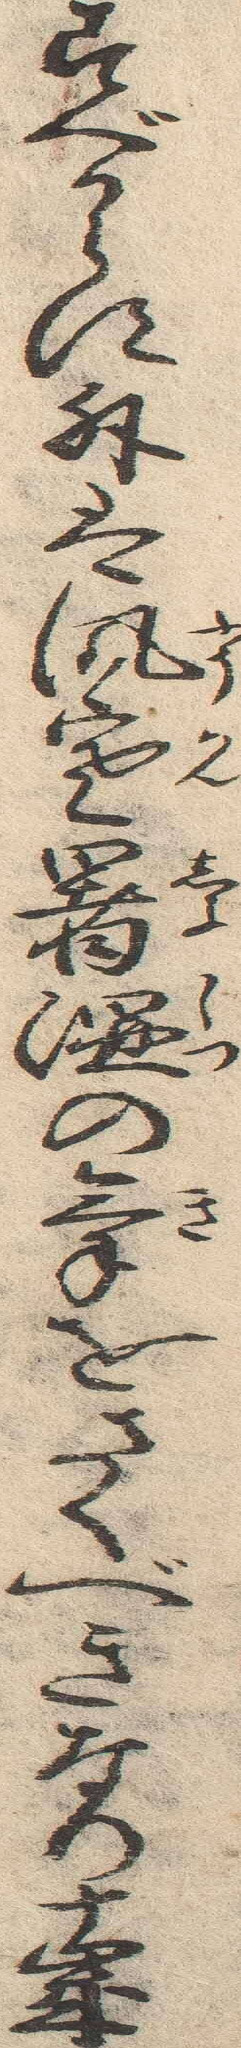すべからす外は風寒暑湿の気をさくべきなり十歳
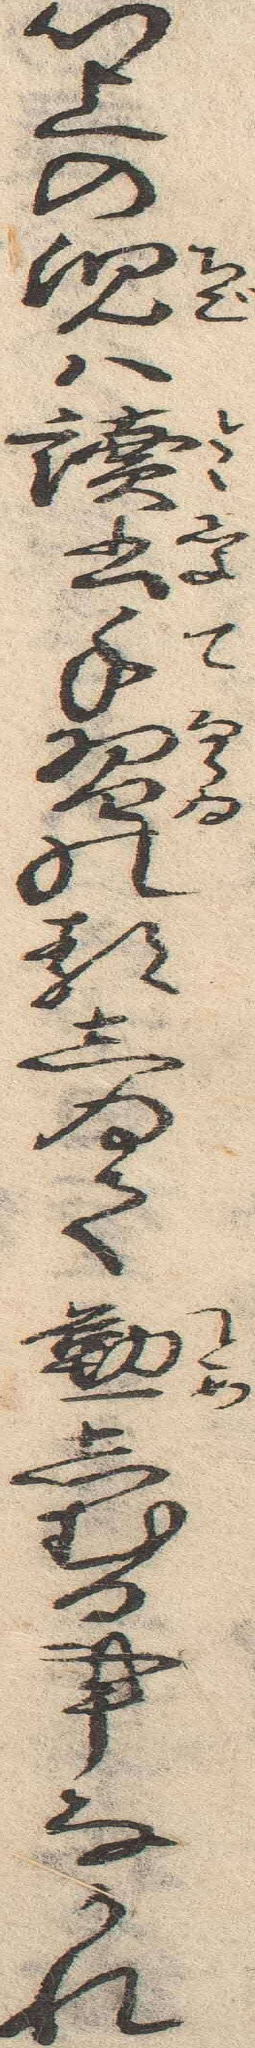以上の児は読書手習の類しゐて懃しむる事なかれ
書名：小児必用養育草
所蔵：東京学芸大学附属図書館 国文学研究資料館
